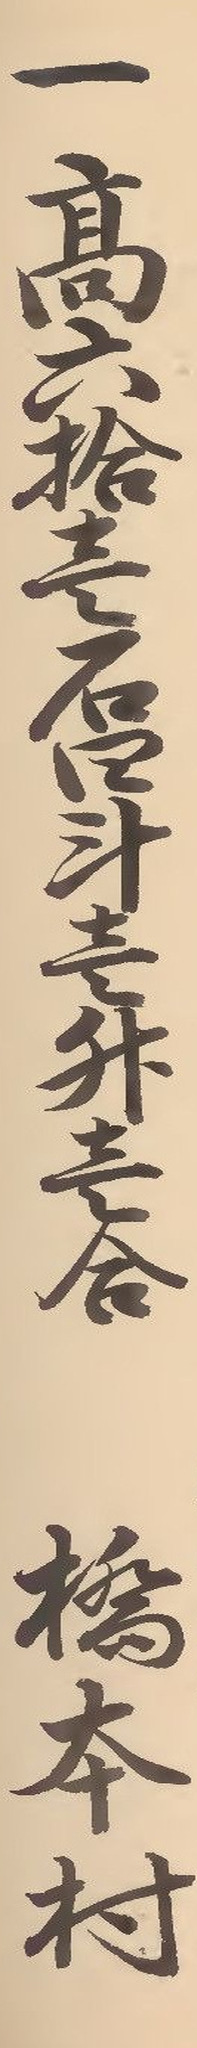一高六拾壱石四斗壱升壱合橋本村
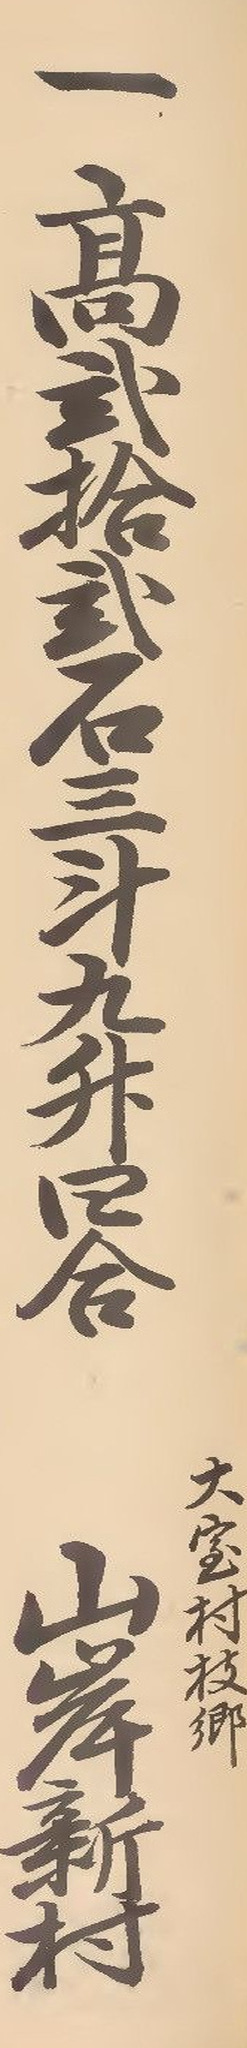一高弐拾弐石三斗九升四合山岸新村
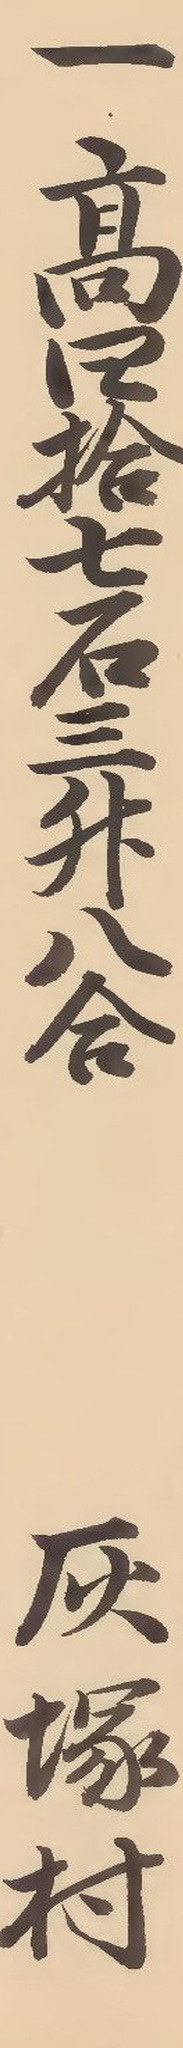一高四拾七石三升八合灰塚村
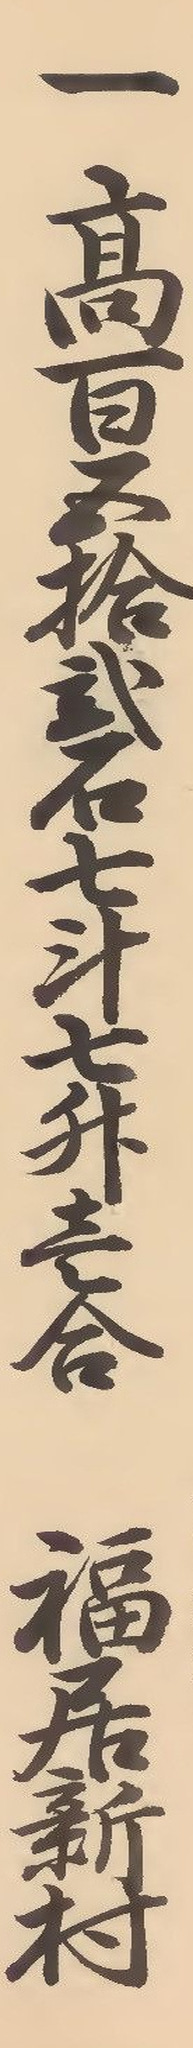一高百五拾弐石七斗七升壱合福居新村
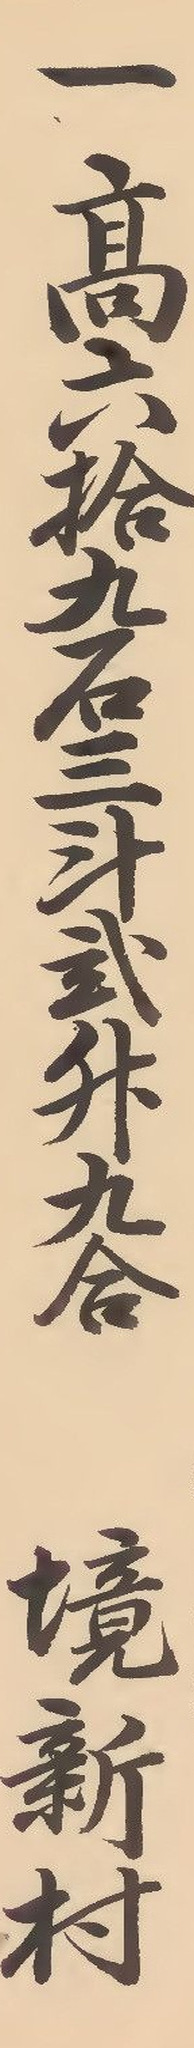一高六拾九石三斗弐升九合境新村

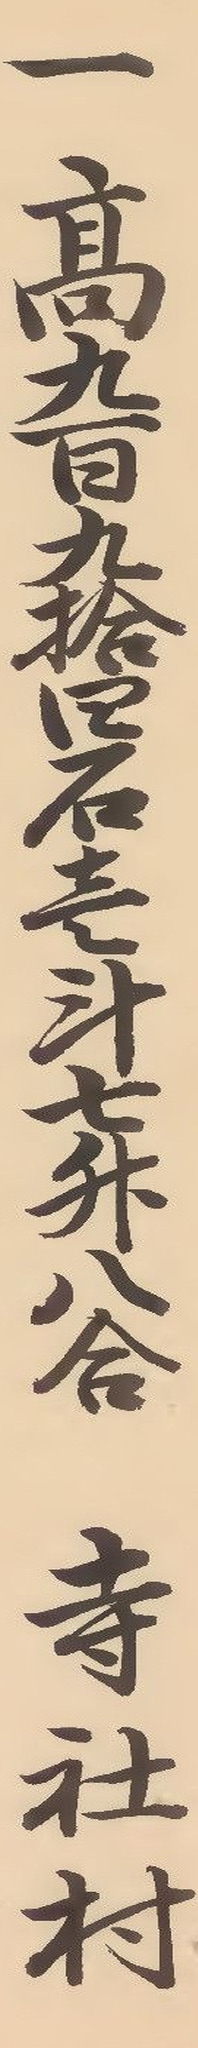一高九百九拾四石壱斗七升八合寺社村
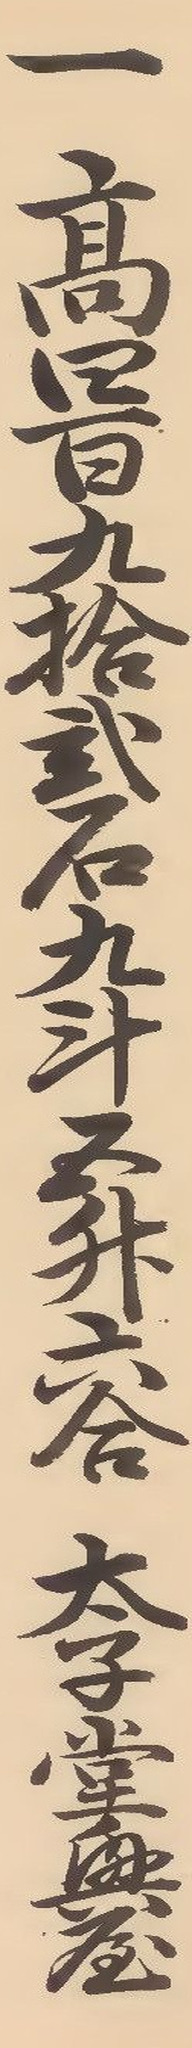一高四百九拾弐石九斗五升六合太子堂興屋
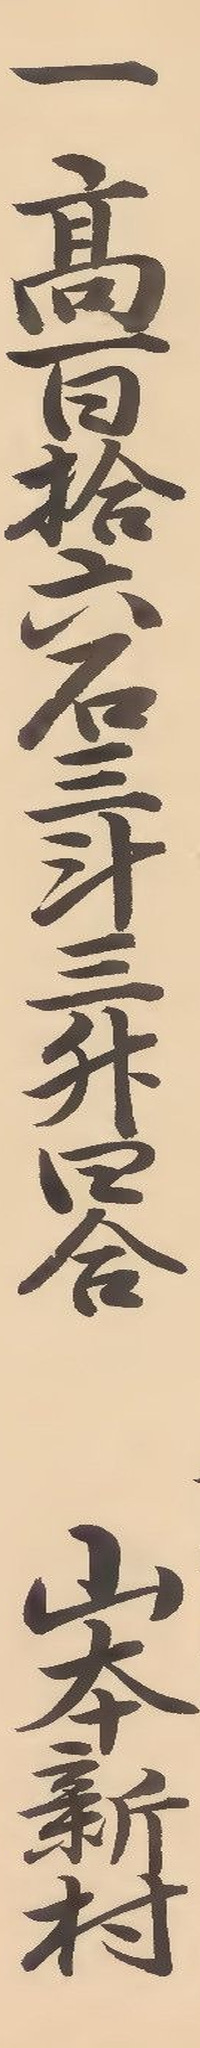一高百拾六石三斗三升四合山本新村
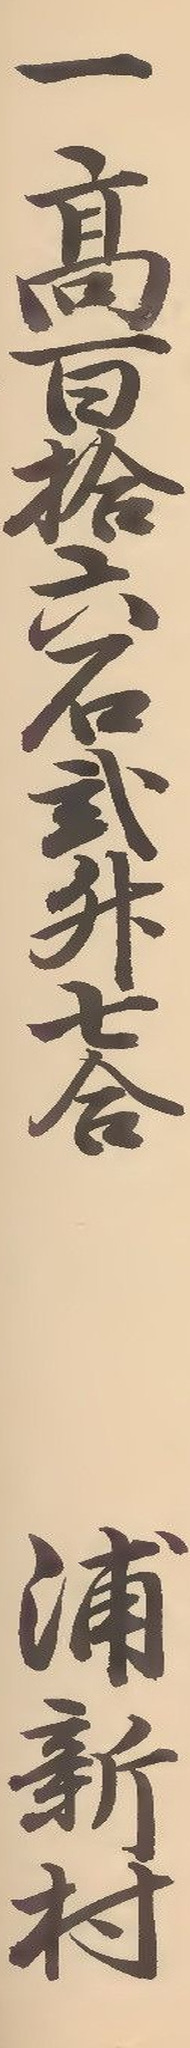一高百拾六石弐升七合浦新村
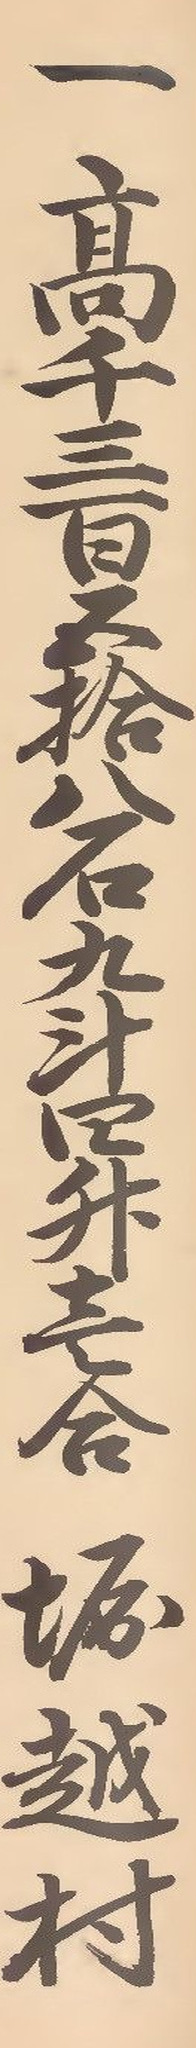一高千三百五拾八石九斗四升壱合堀越村
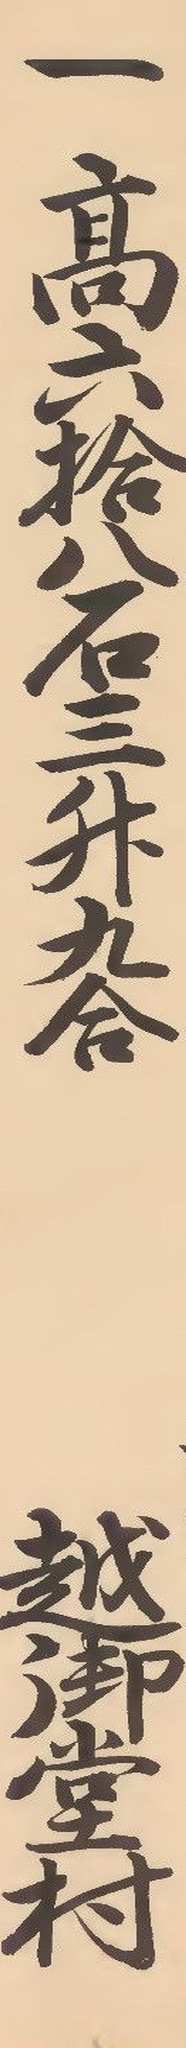一高六拾八石三升九合越御堂村
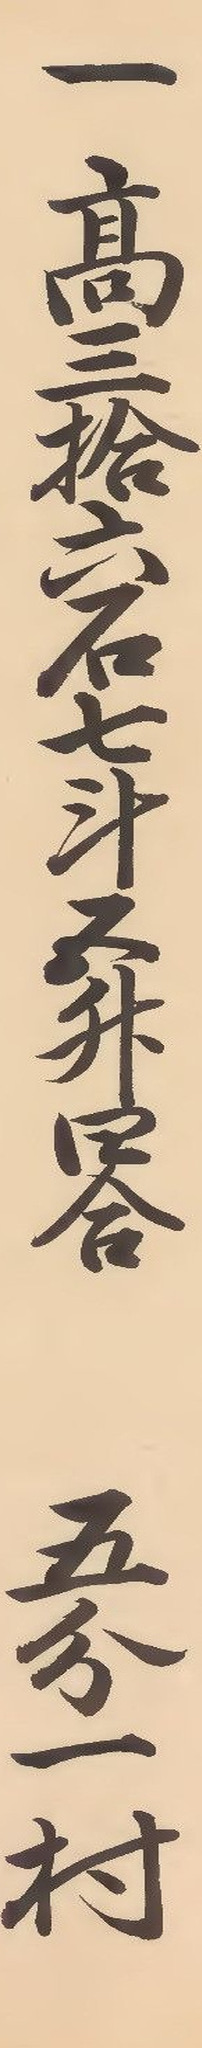一高三拾六石七斗五升四合五分一村
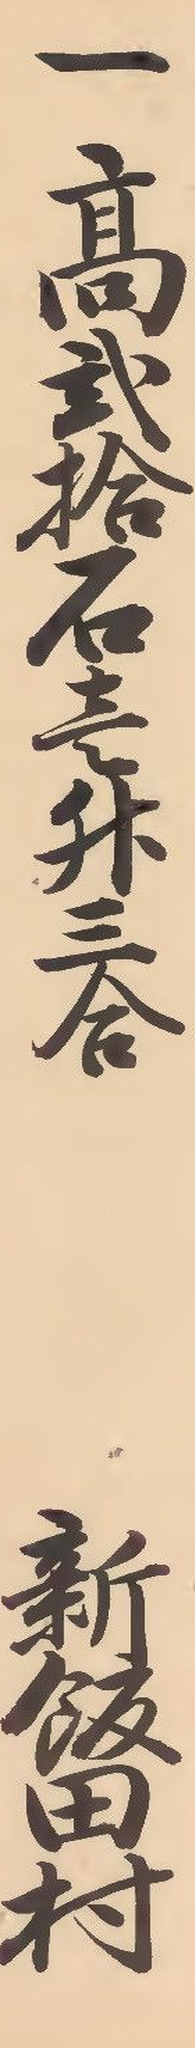一高弐拾石壱升三合新飯田村

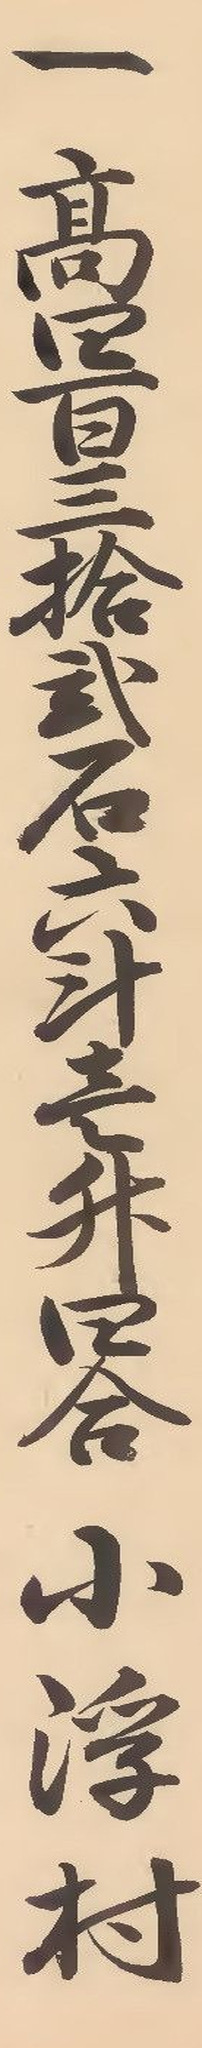一高四百三拾弐石六斗壱升四合小浮村
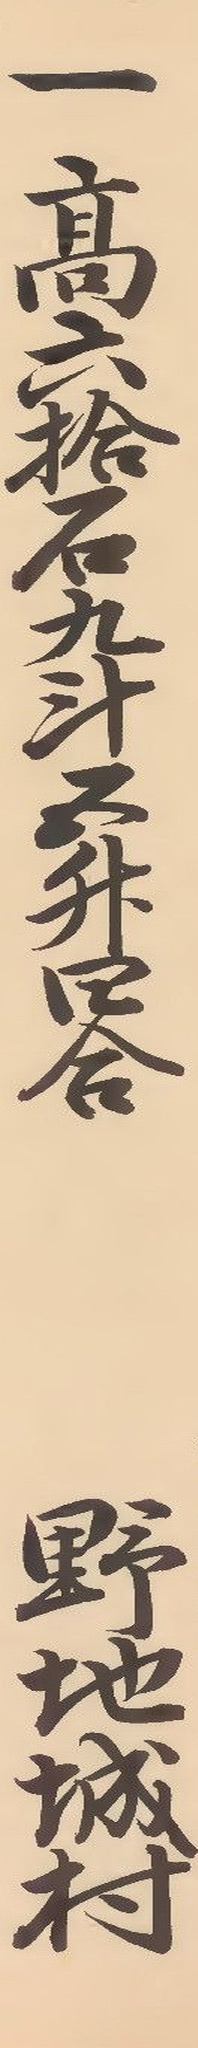一高六拾石九斗五升四合野地城村
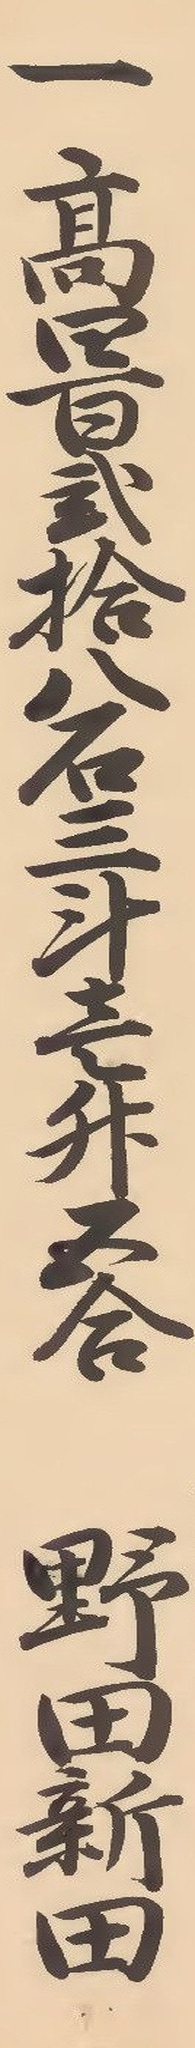一高四百弐拾八石三斗壱升五合野田新田
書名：越後国郷帳　下
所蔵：国立公文書館 National Archives of Japan
